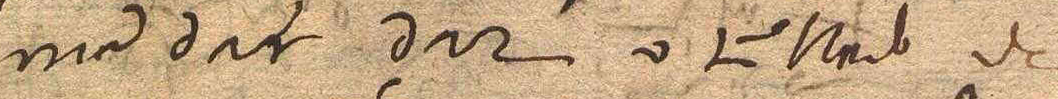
mādar dar o t̄llado de
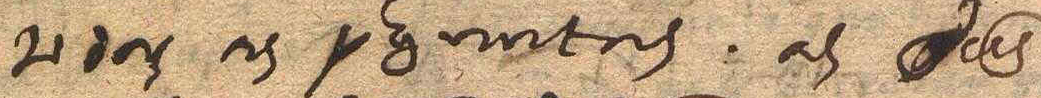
todas as p̄guntas. as q̄es
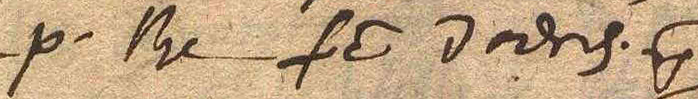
.p. lhe ꞩē dadas. c̄ꝭ
